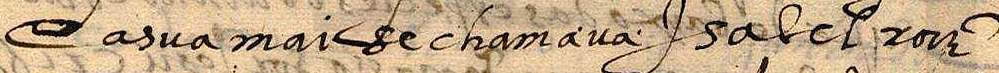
e a sua mai se chamaua Jsabel roiz̄
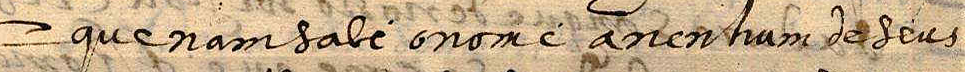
e que nam sabe o nome a nenhum de seus
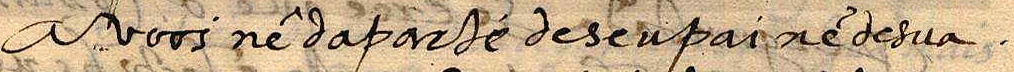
avoos nē da parte de seu pai nē de sua
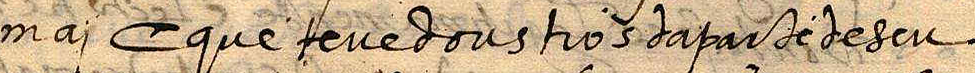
maj e que teue dous tios da parte de seu
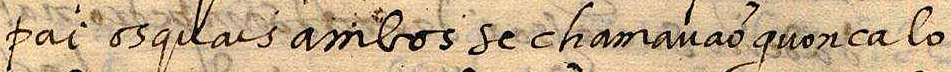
pai os quais ambos se chamauaõ guoncalo
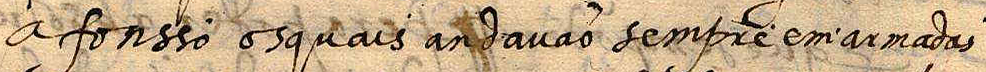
afonsso os quais andauaõ sempre em armadas
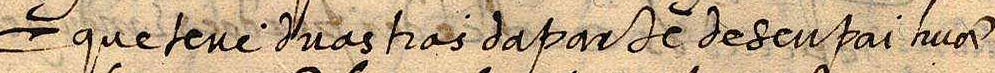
e que teue duas tias da parte de seu pai huã
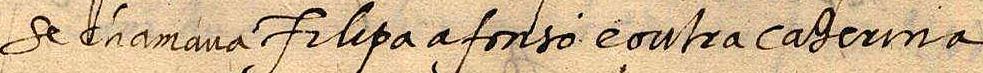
se chamaua filipa afonso e outra caterina
